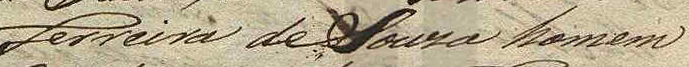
Ferreira de Souza homem
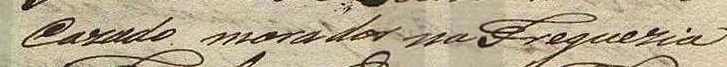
cazado morador na Freguezia
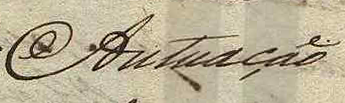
Autuaçaõ
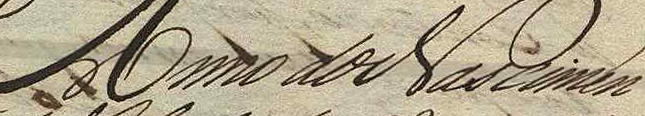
Anno do Nascimen
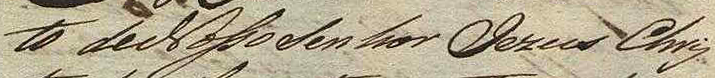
to de Nosso Senhor Iezus Chris
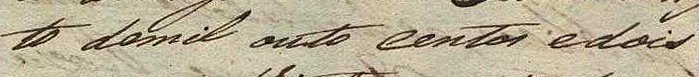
to de mil outocentos e dois
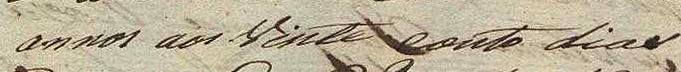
annos aos Vinte e outo dias
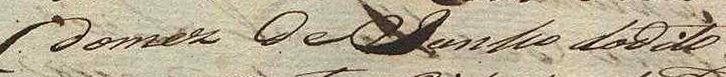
do mez de Iunho do dito
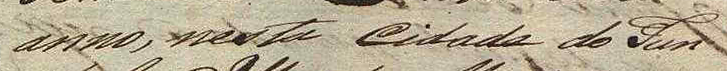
anno, nesta cidade do Fun
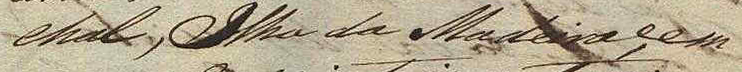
chal, Ilha da Madeira, e em
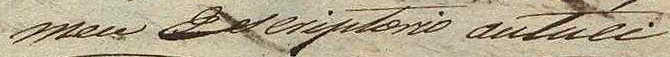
meu Escriptorio autuei
